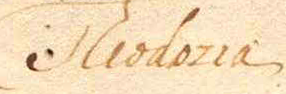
Theodozia
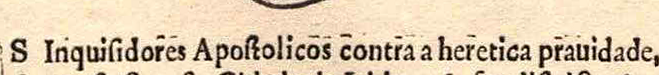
S Inquisidores Apostolicos contra a heretica prauidade,
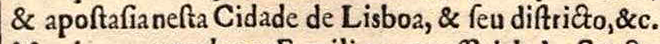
& apostasia nesta Cidade de Lisboa, & seu districto, &c.
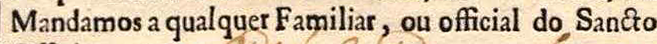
Mandamos a qualquer Familiar, ou official do Sancto
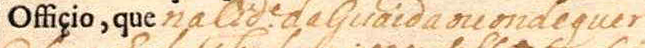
Officio, que na Cid.e da Guarda neonde quer
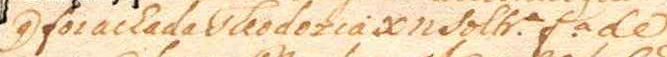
q̄ for achada Theodozia x n soltr.a f.a de
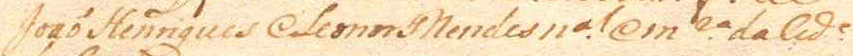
Joaõ Henriques e Leonor Mendes na.l e m.ra da Cid.e
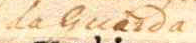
da Guarda
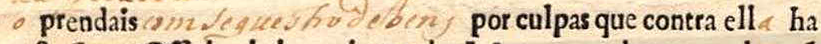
o prendais com sequestro de bens por culpas que contra ella ha
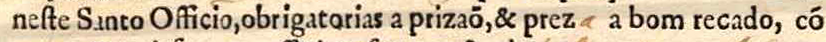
neste Santo Officio, obrigatorias a prizaõ, & preza a bom recado, cō
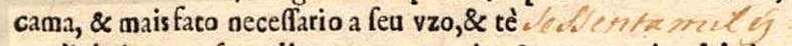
cama, & mais fato necessario a seu vzo, & tè sessenta mil r̄s
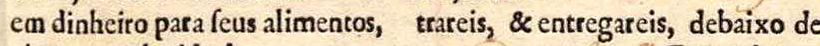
em dinheiro para seus alimentos, trareis, & entregareis, debaixo de
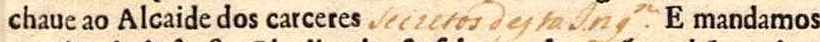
chaue ao Alcaide dos carceres secretos desta Inq.m E mandamos
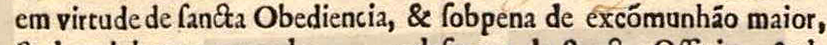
em virtude de sancta Obediencia, & sobpena de excōmunhão maior,
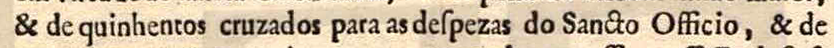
& de quinhentos cruzados para as despezas do Sancto Officio, & de
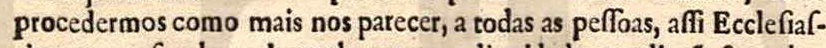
procedermos como mais nos parecer, a todas as pessoas, assi Ecclesias
